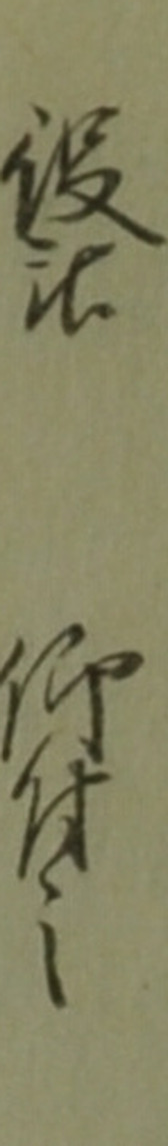役被仰付之
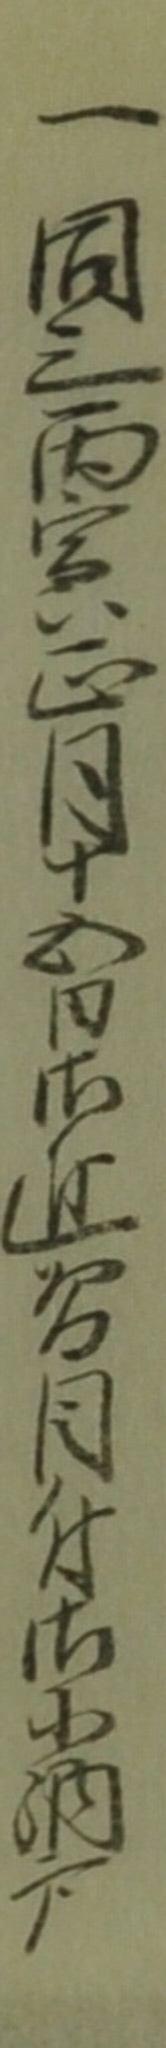一同三丙寅正月十五日御近習目付御小納戸
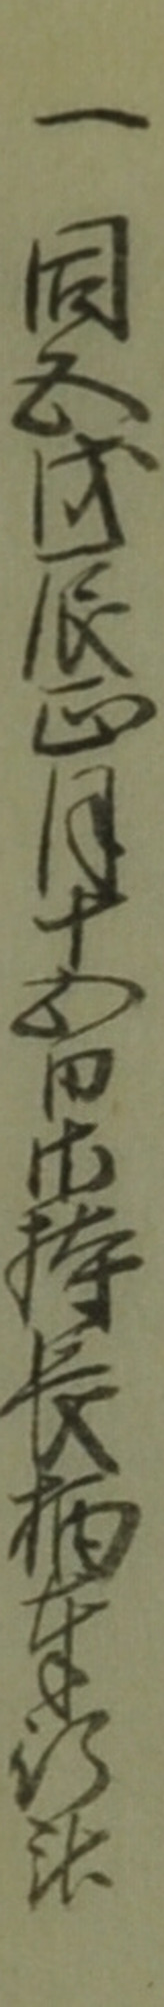一同五戊辰正月十五日御持長柄奉行被
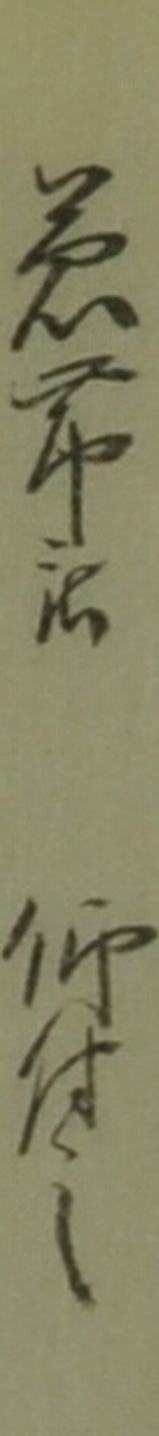兼帯被仰付之
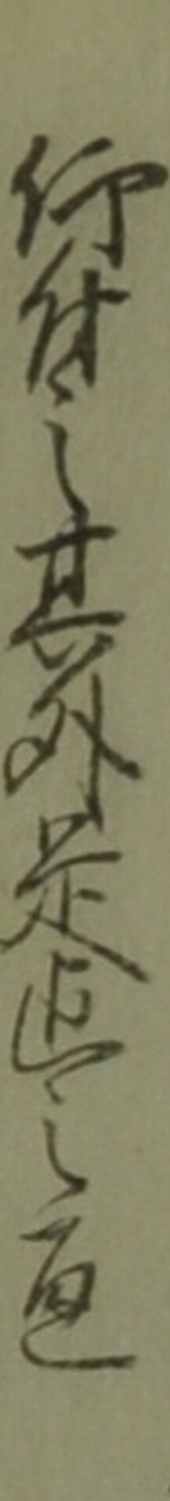仰付之其外是迄之通
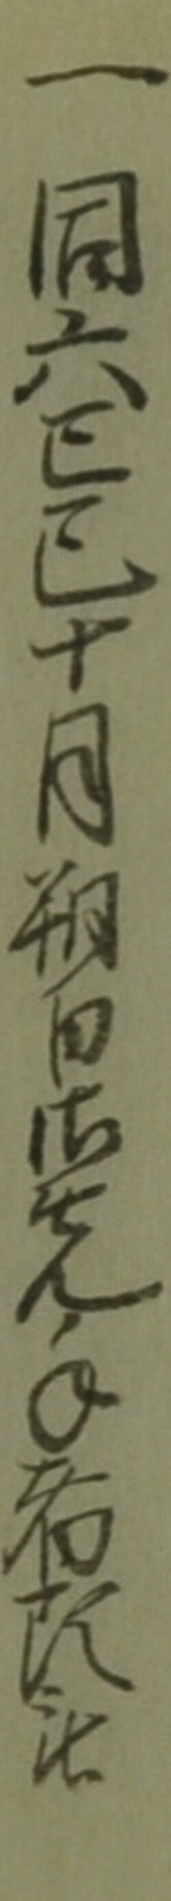一同六己巳十月朔日御先手者頭被
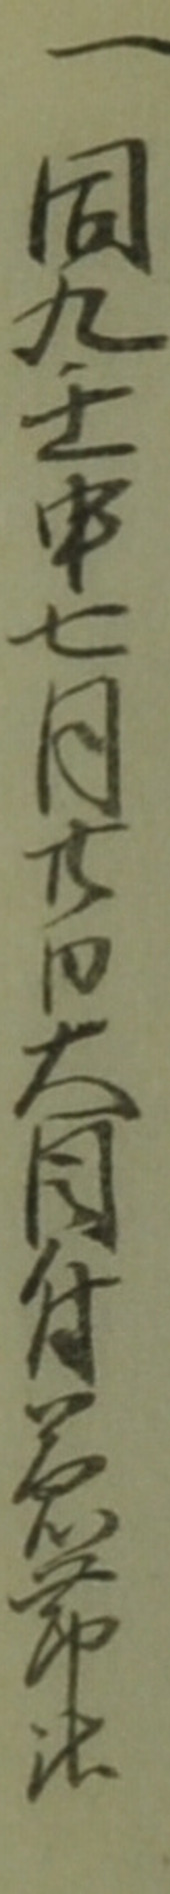一同九壬申七月廿日大目付兼帯被
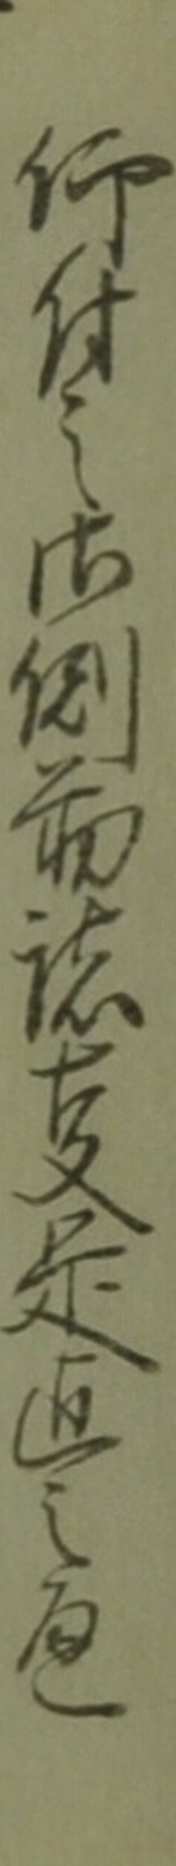仰付之御側勤諸事是迄之通
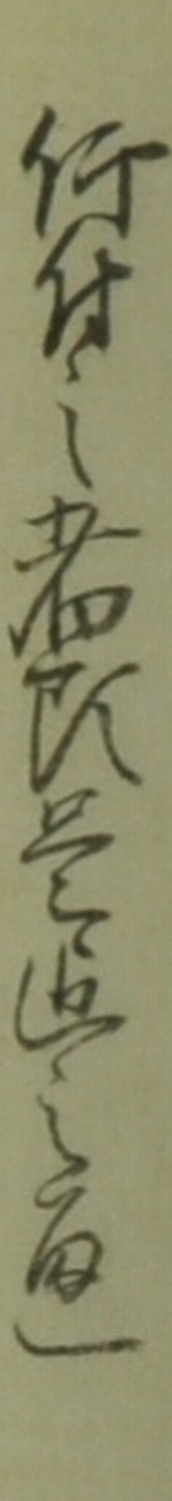仰付之者頭是迄之通

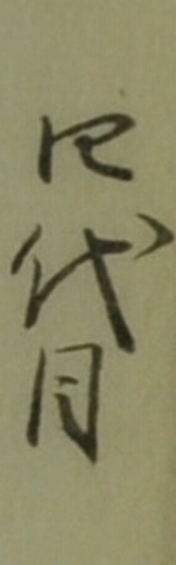四代目
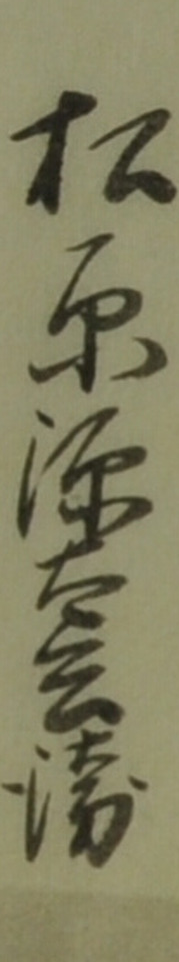松原源太兵衛
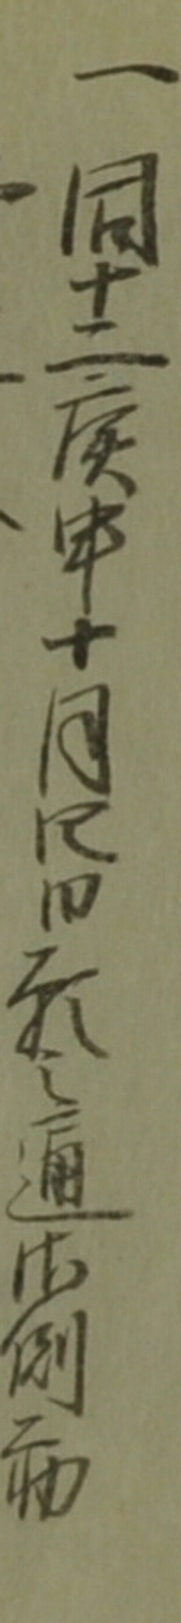一同十二甲信庚申十月四日願之通御側勤
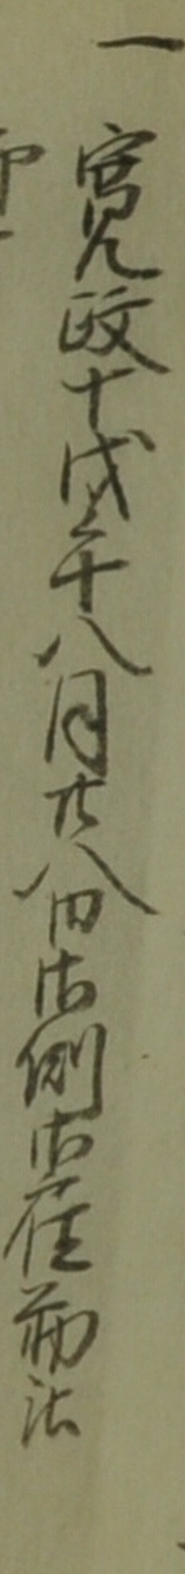一寛政十戊午八月廿八日御側御雇勤被
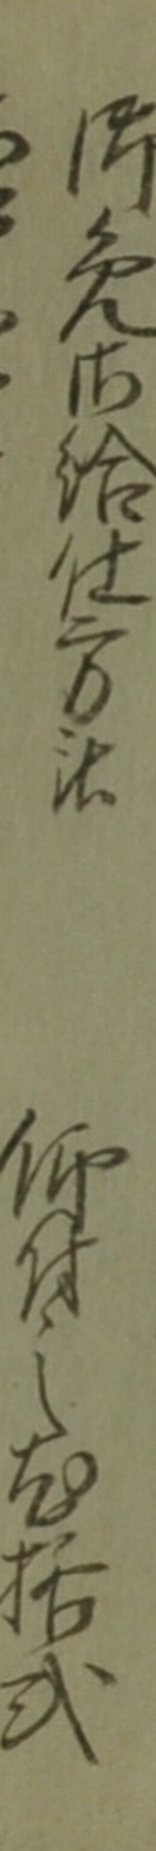御免御給仕方被仰付之尤格
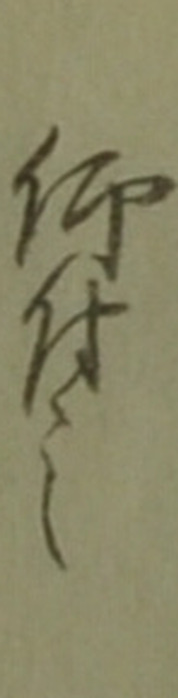仰付之
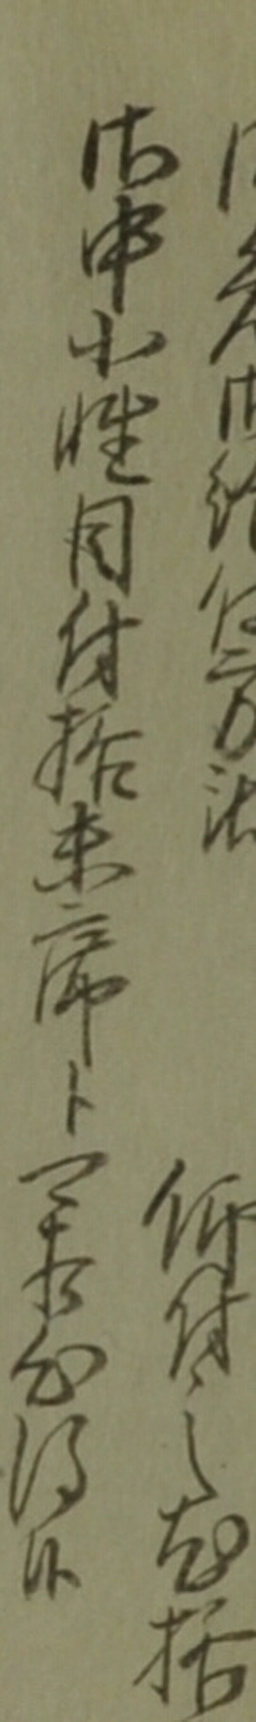御中小性目付格末席ト可相心得候
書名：諸御役代々録（五）
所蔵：伊那市立高遠町図書館・合同会社AMANE
